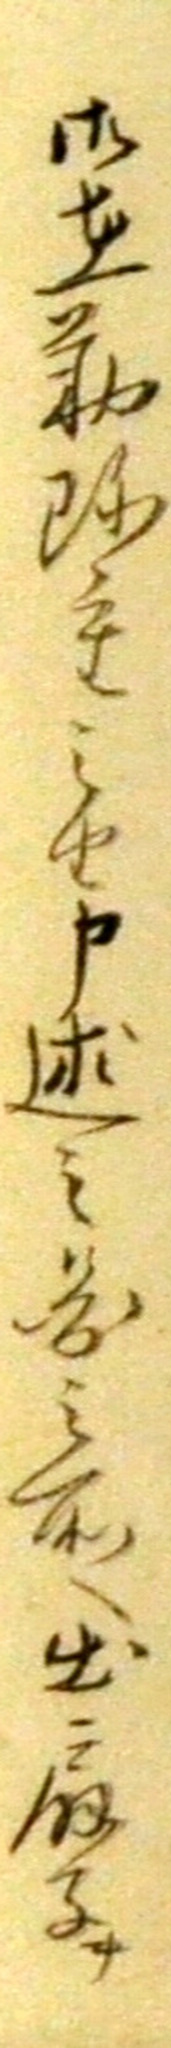御在勤珍重之由申述之図之所へ出扇子ヲ

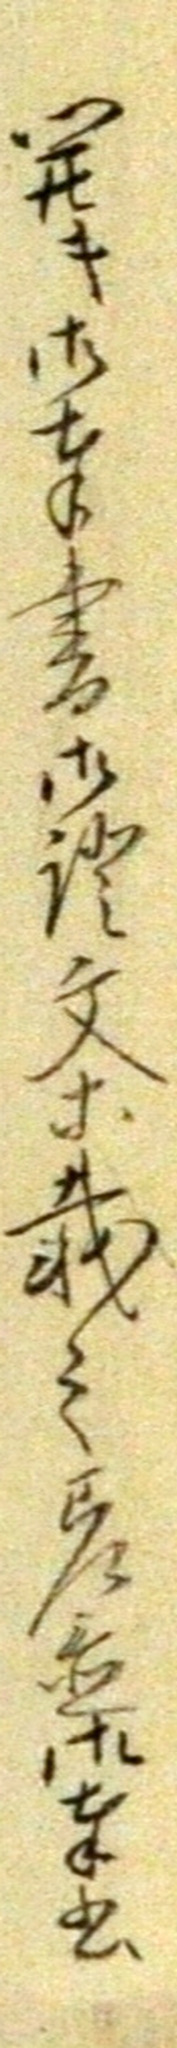開キ御奉書御證文等載之差置御奉書
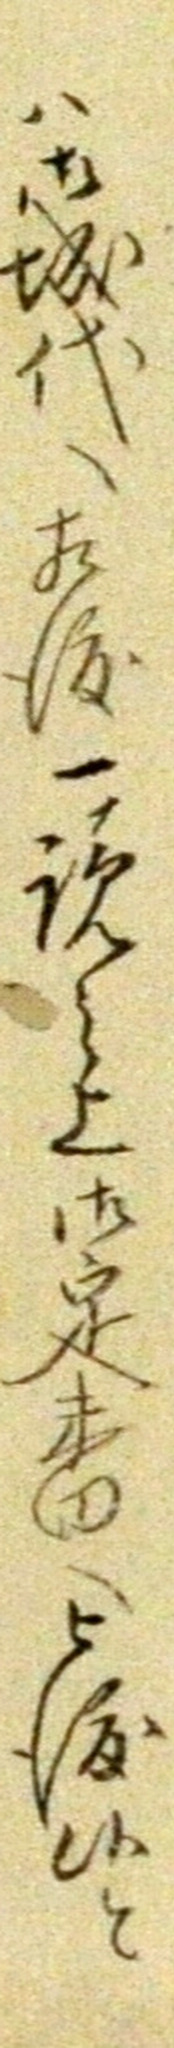は御城代ヘ相渡一読之上御定番へ被渡候と
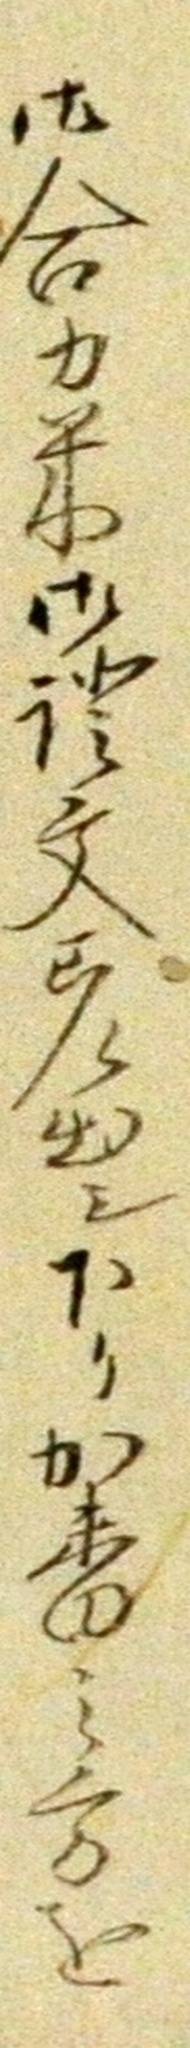御合力米御證文差出シ下り加番之方を
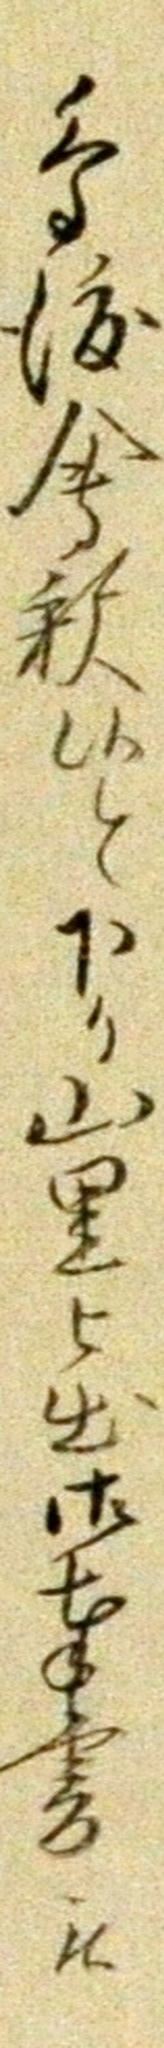鳥渡会釈候と下り山里被出御奉書被
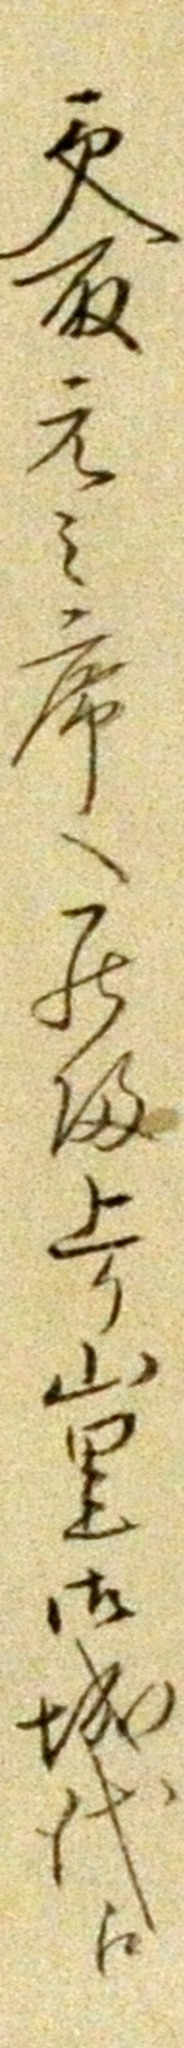受取元之席へ罷帰上り山里御城代え
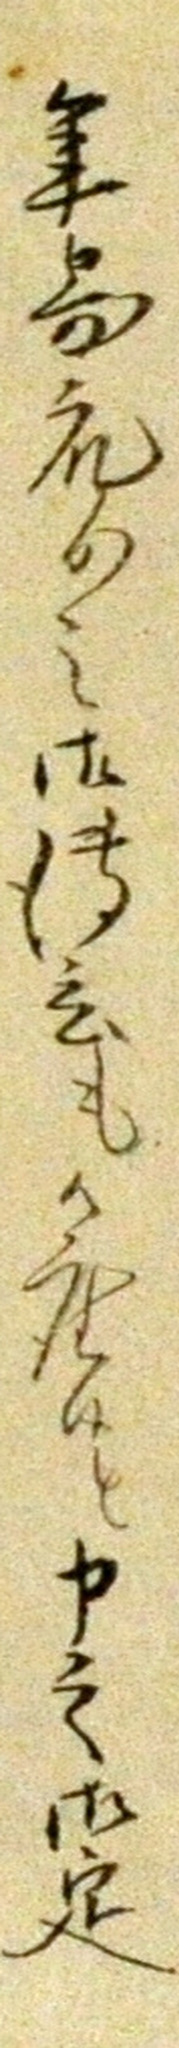年寄衆ゟ之御伝言も御座候と申之御定
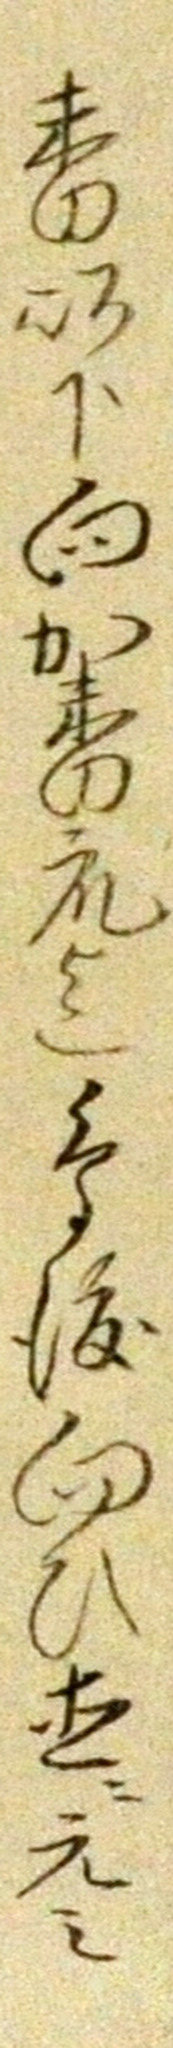番以下向加番衆迄鳥渡向ひ直に元之
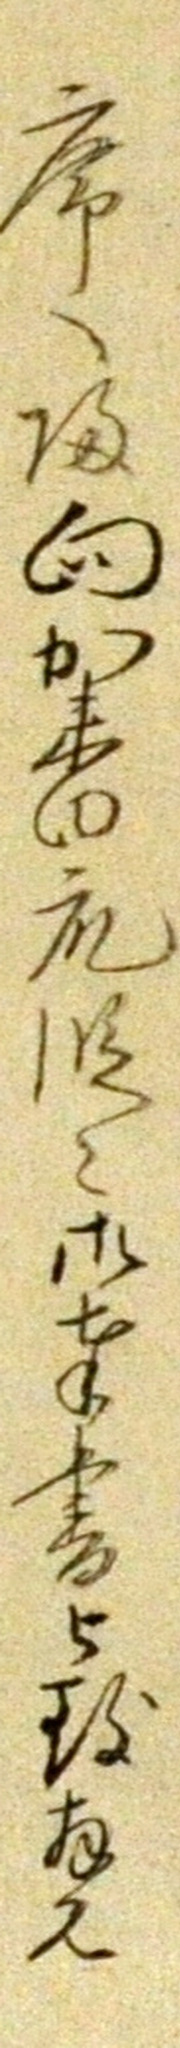席へ帰向加番衆段々御奉書被致拝見
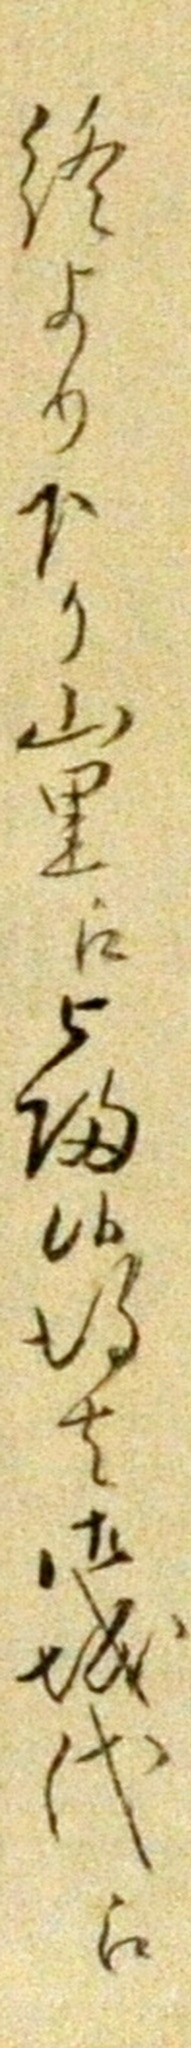終より下り山里え被帰候得は御城代え
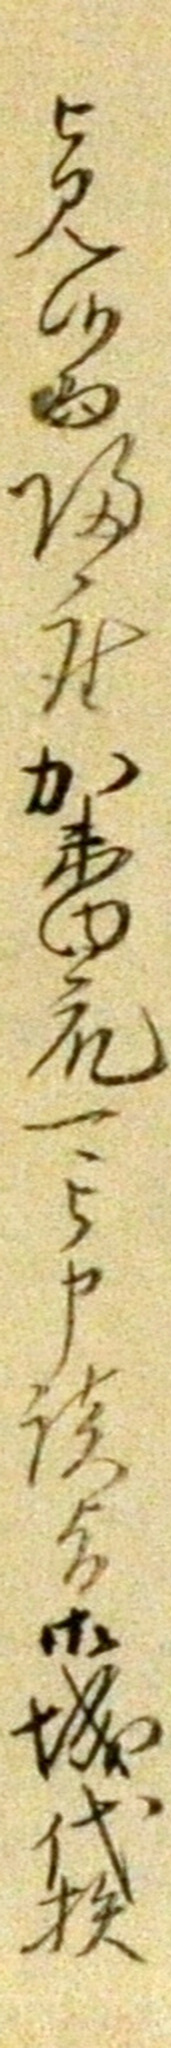被見候而帰座加番衆可被申談旨御城代挨
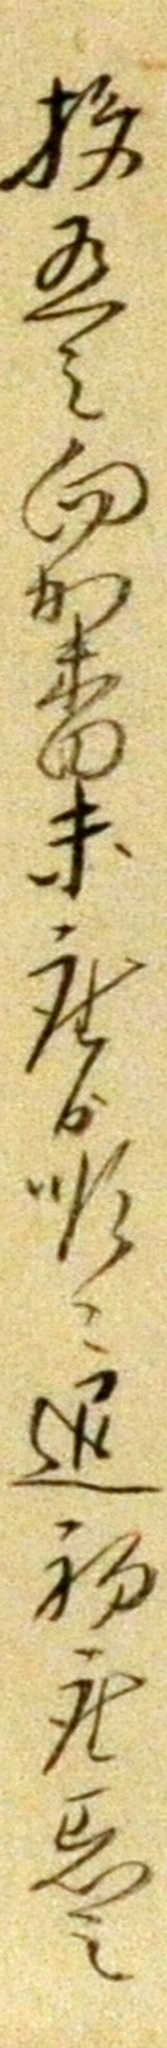拶有之向加番末座ゟ順に退初座着之
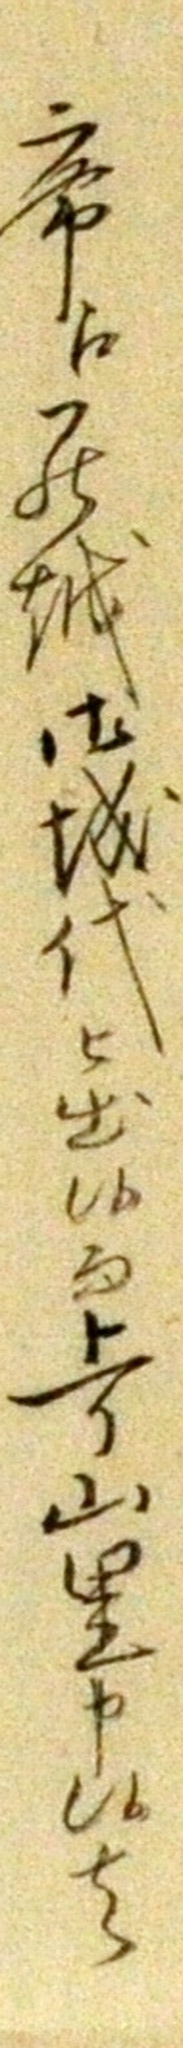席え罷越御城代被出候而上り山里申候は
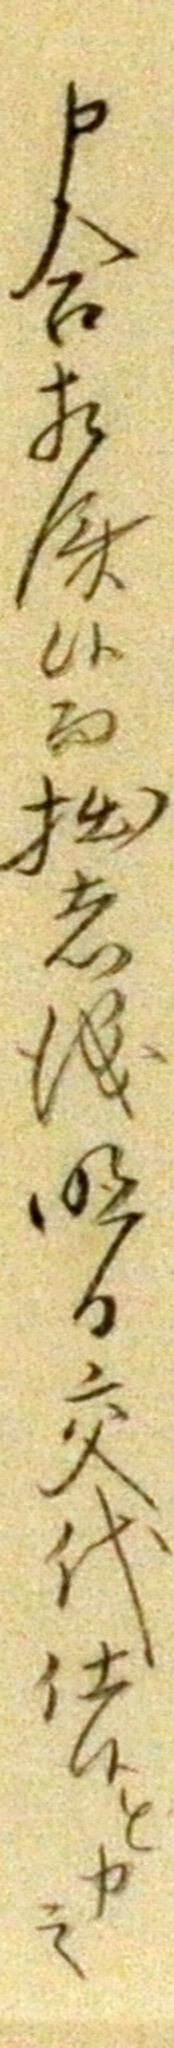申合相済候而拙者儀明日交代仕候と申之
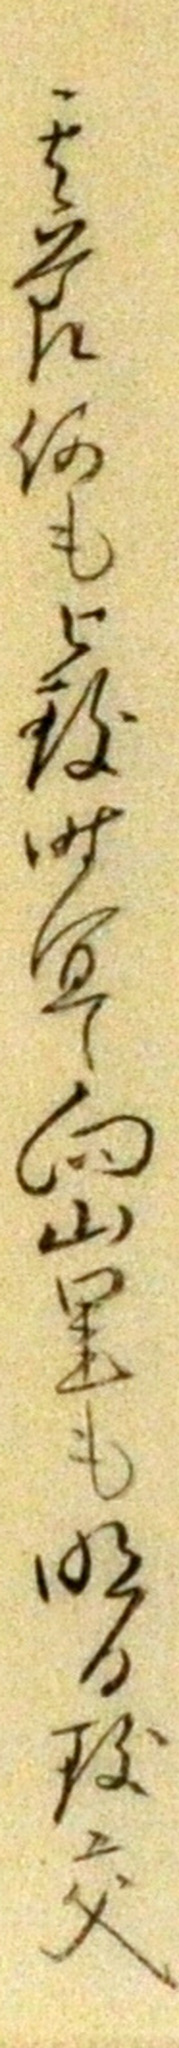其節何も被致時宜候向山里も明日致交
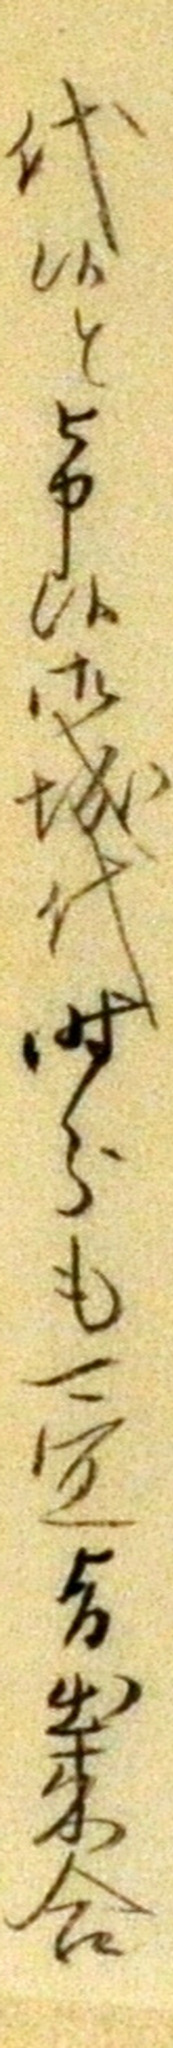代候と被申候御城代時分も可宜旨出来合
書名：大阪加番関係諸書留〔一括〕
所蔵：伊那市立高遠町図書館・合同会社AMANE
